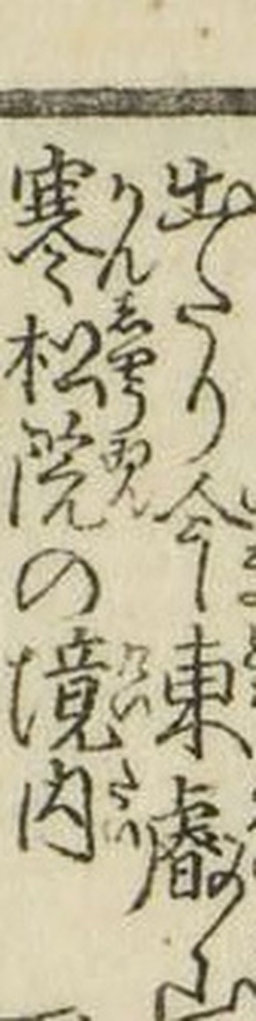寒松院の境内
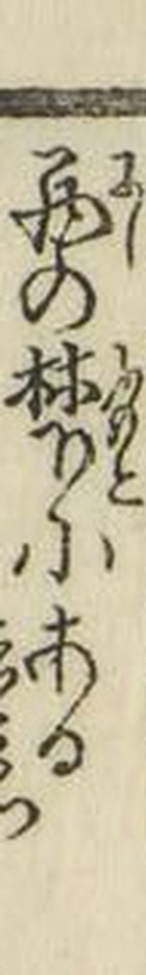西の梺にある
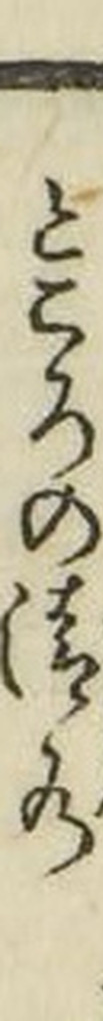ところの清水
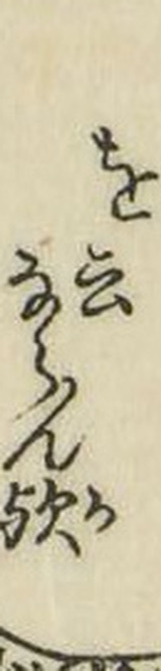ならん歟
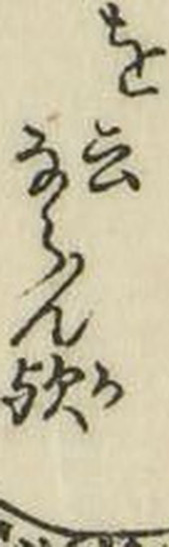ならん歟

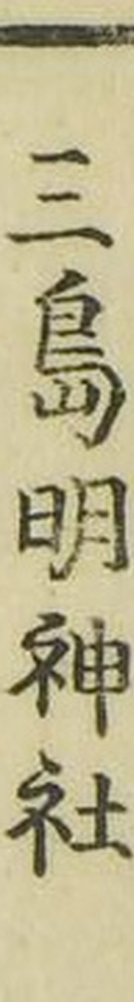三島明神社
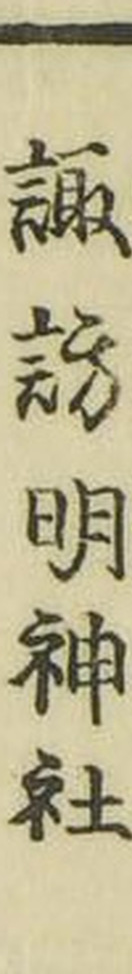諏訪明神社
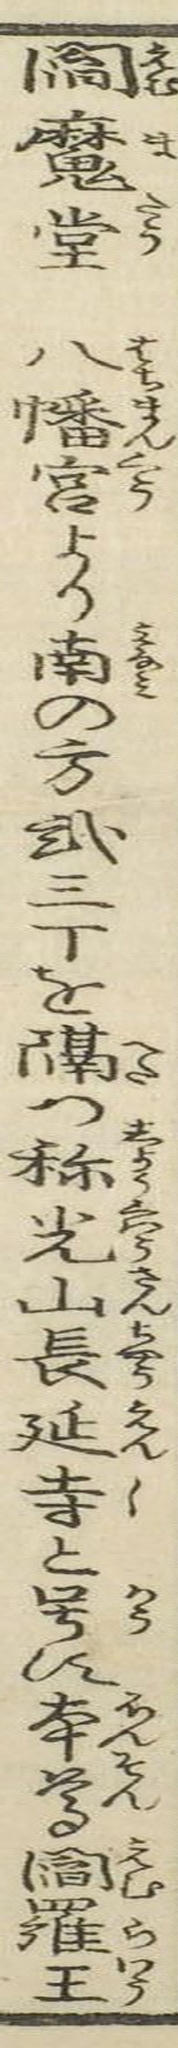閻魔堂八幡宮より南の方弐三丁を隔つ称光山長延寺と号す本尊閻羅王
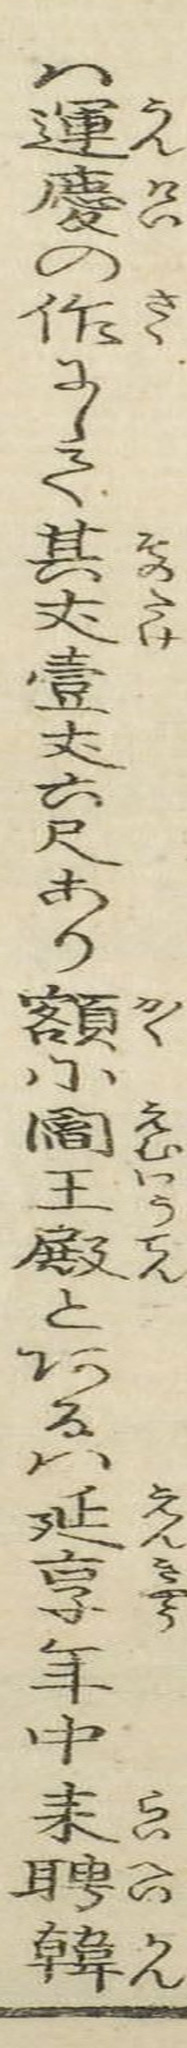は運慶の作にして其丈壱丈六尺あり額に閻王殿とあるは延享年中来聘韓
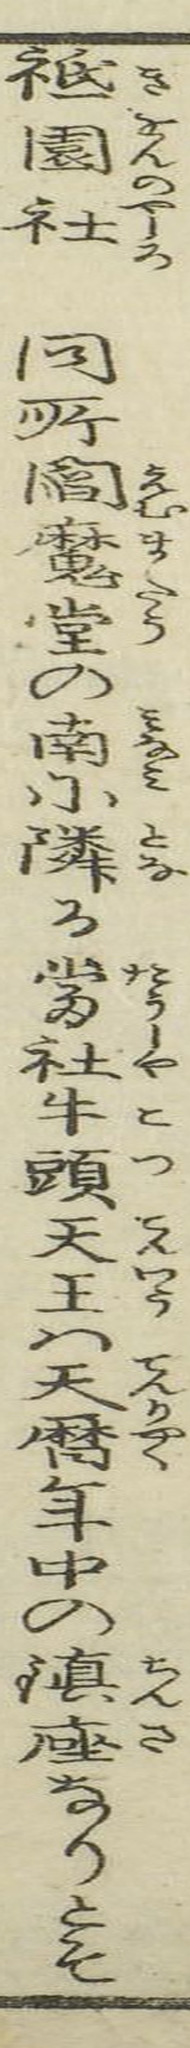祗園社同所閻魔堂の南に隣る当社牛頭天王は天暦年中の鎮座なりとそ
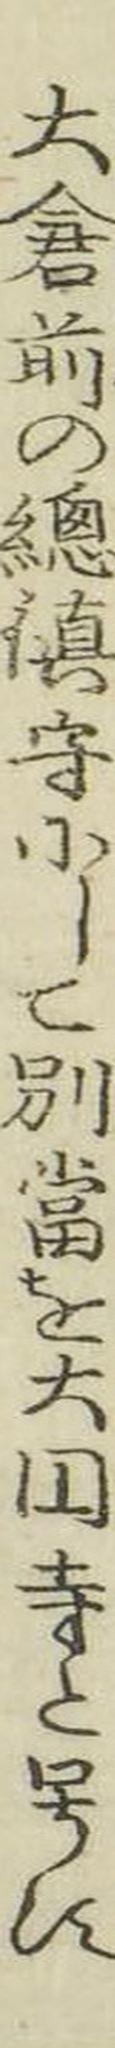大倉前の総鎮守にして別当を大円寺と号す
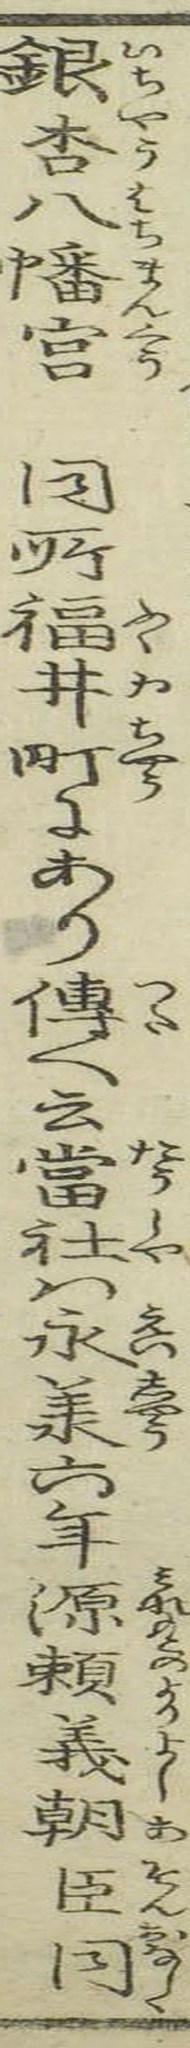銀杏八幡宮同所福井町にあり伝へ云当社は永承六年源頼義朝同

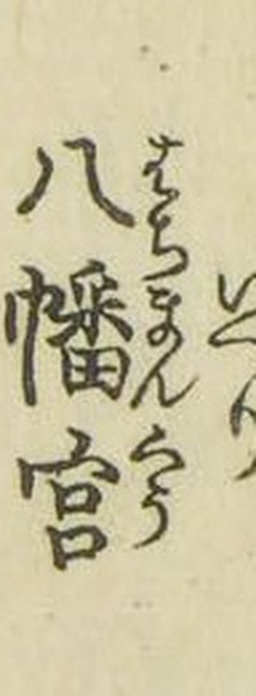八幡宮

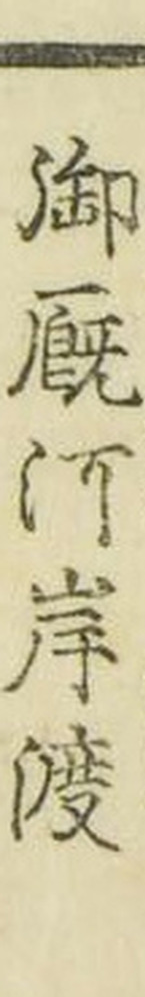御厩河岸渡
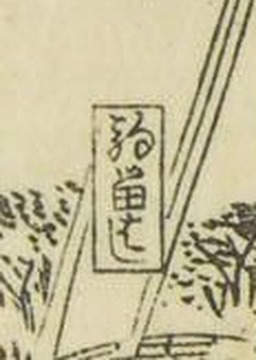駒留はし
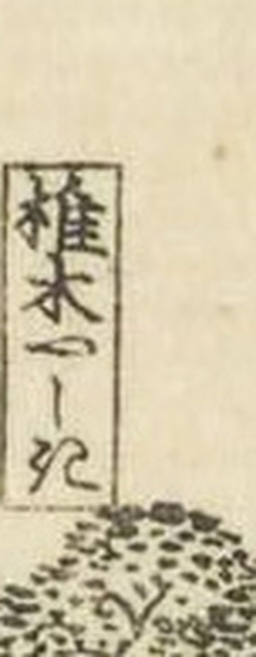椎木やしき
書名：江戸名所図会 20巻 巻之16
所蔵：東京学芸大学教育コンテンツアーカイブ
